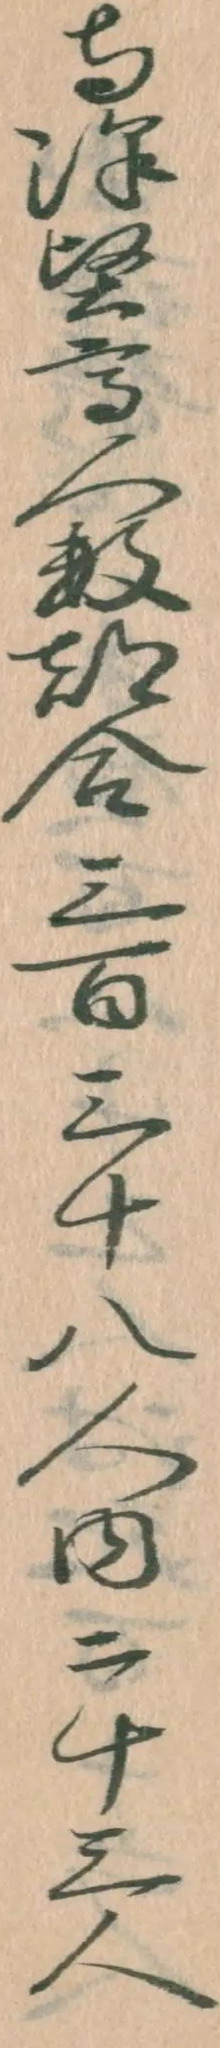寺沢堅高人数都合三百三十八人内二十三人
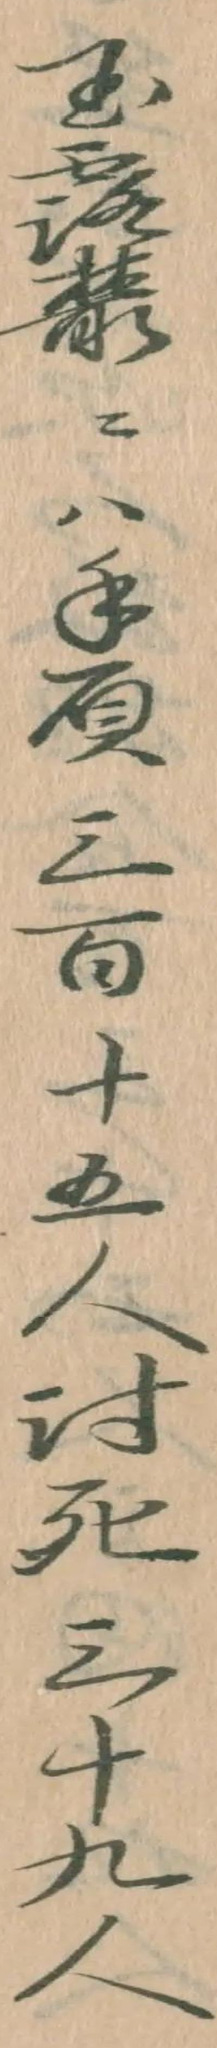玉露樷には手負三百十五人討死三十九人
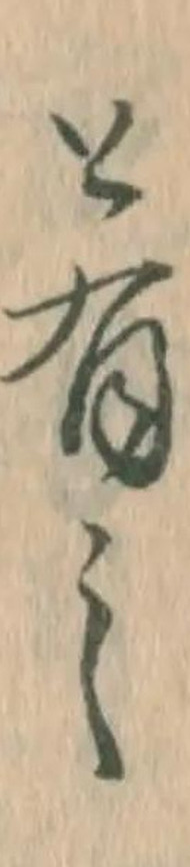と有之
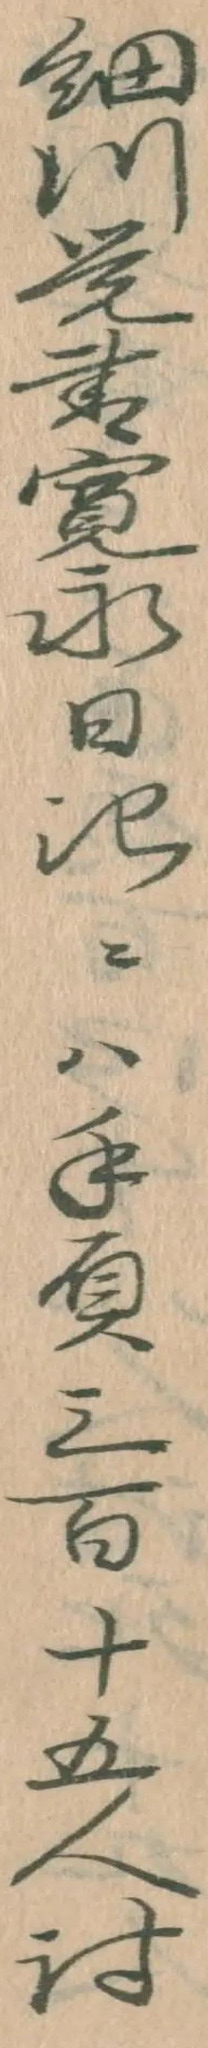細川覚書寛永日記には手負三百十五人討
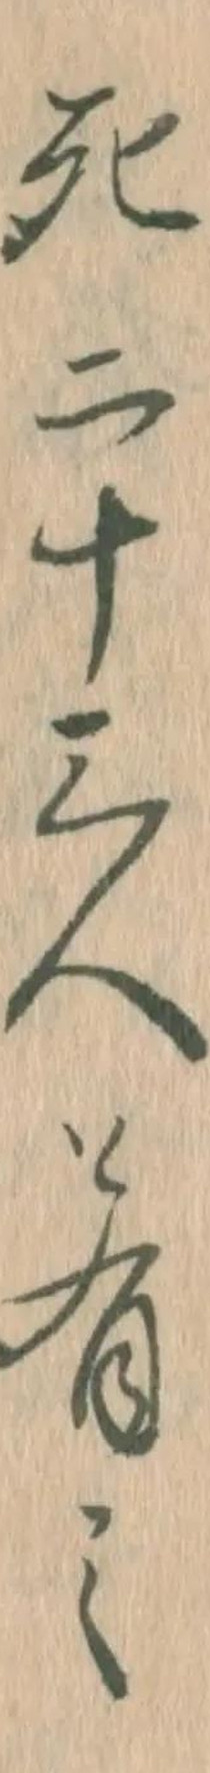死二十三人と有之
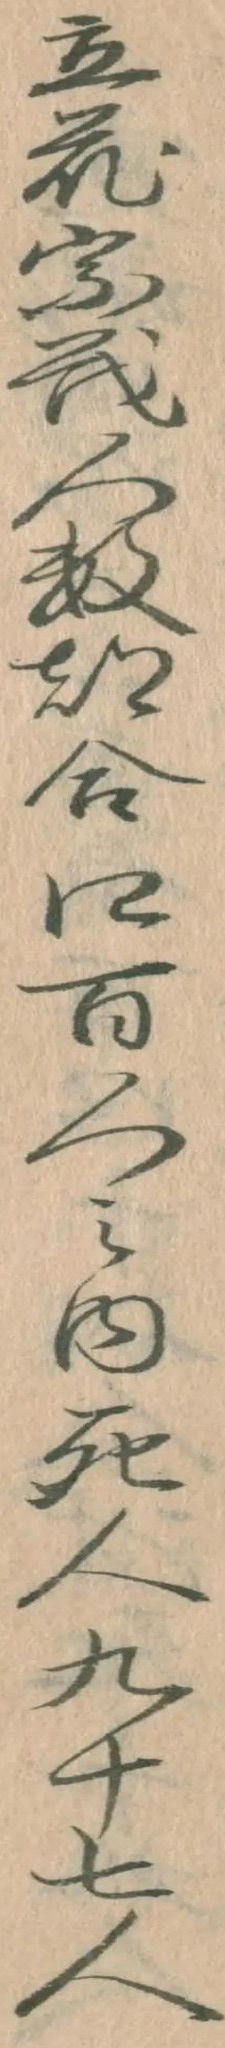立花宗茂人数都合四百人之内死人九十七人
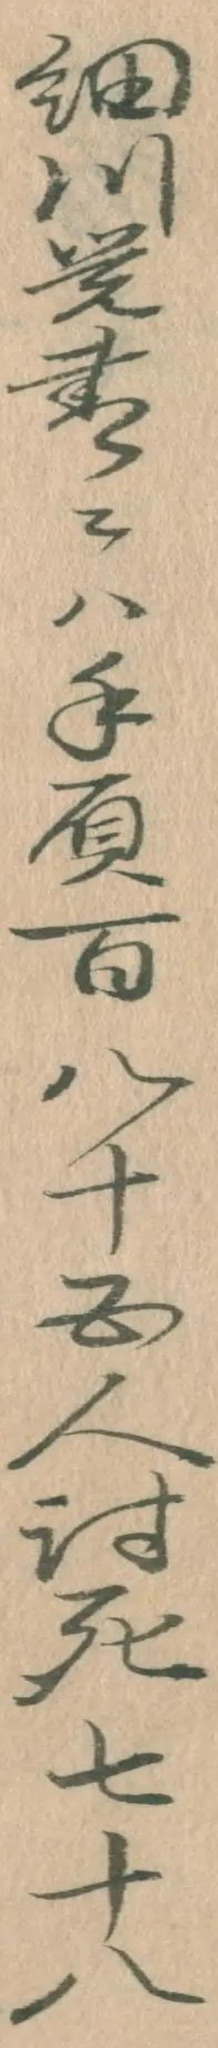細川覚書には手負百八十五人討死七十八
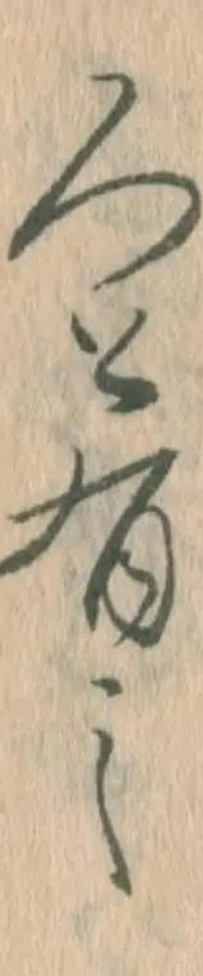人と有之
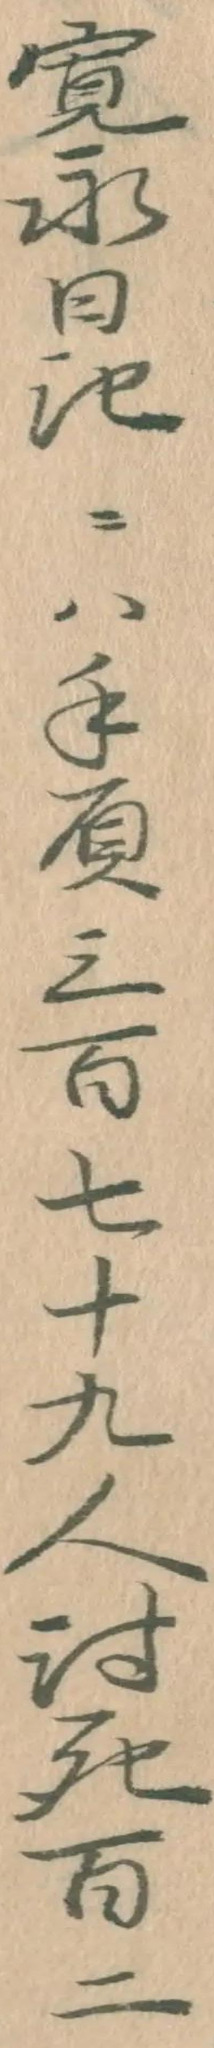寛永日記には手負三百七十九人討死百二
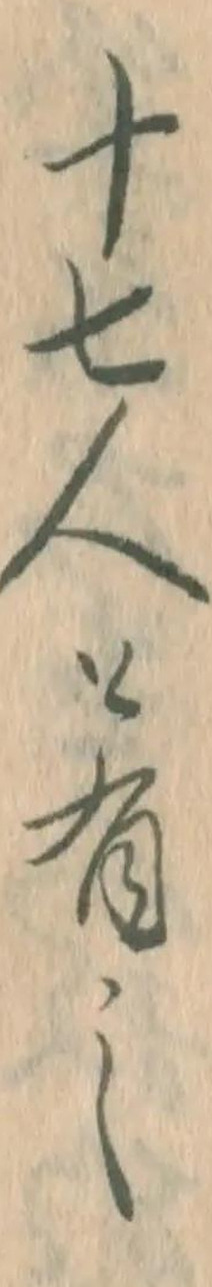十八人と有之

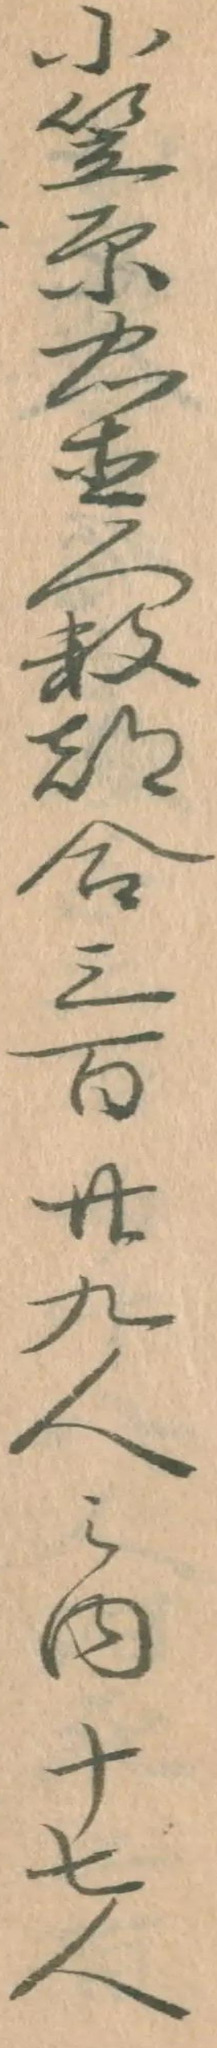小笠原忠直人数都合三百廿九人之内十七人
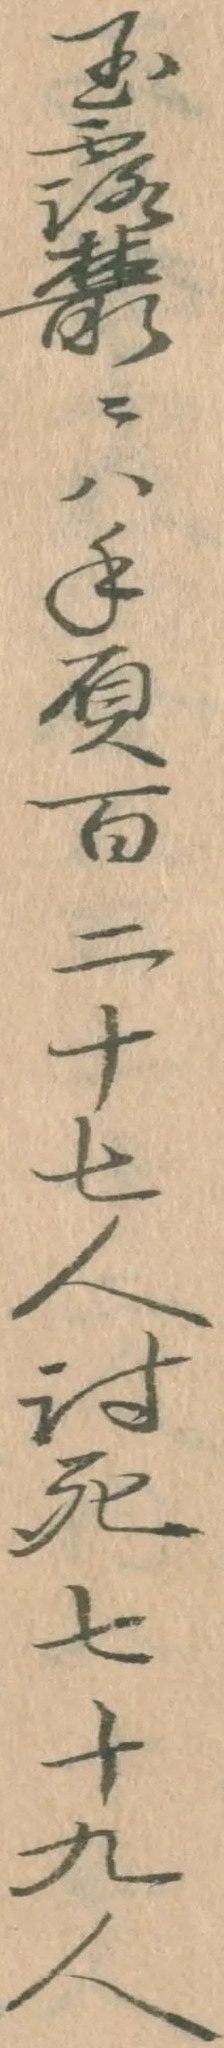玉露樷には手負百二十六人討死七十九人
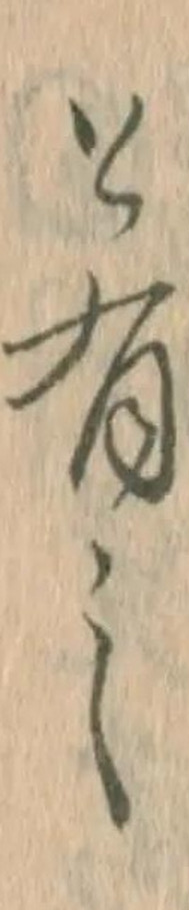と有之
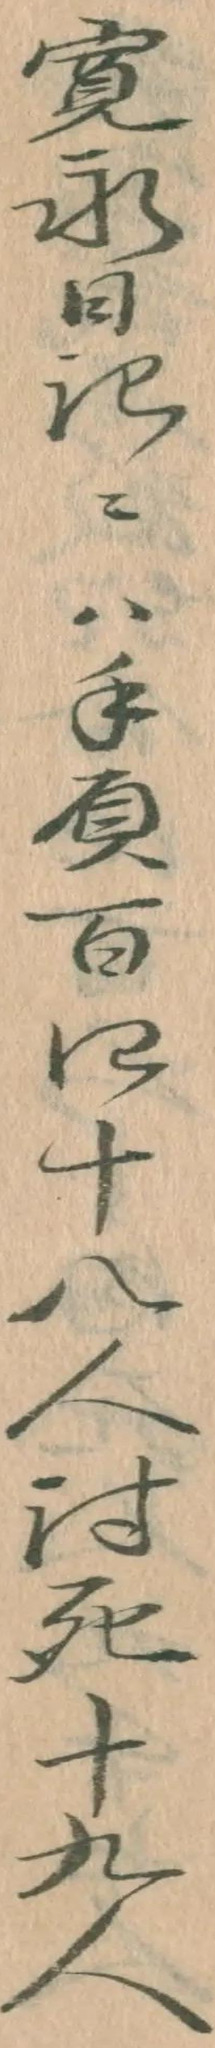寛永日記には手負百四十八人討死十九人
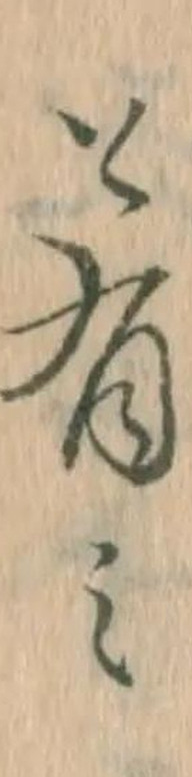と有之
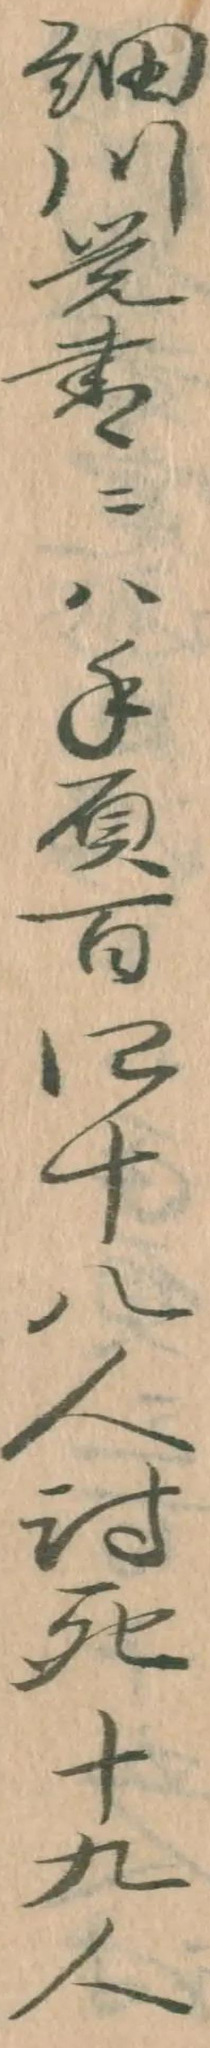細川覚書には手負百四十八人討死十九人
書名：切支丹御退治記 49巻. [9]
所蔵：国立国会図書館 National Diet Library, JAPAN
